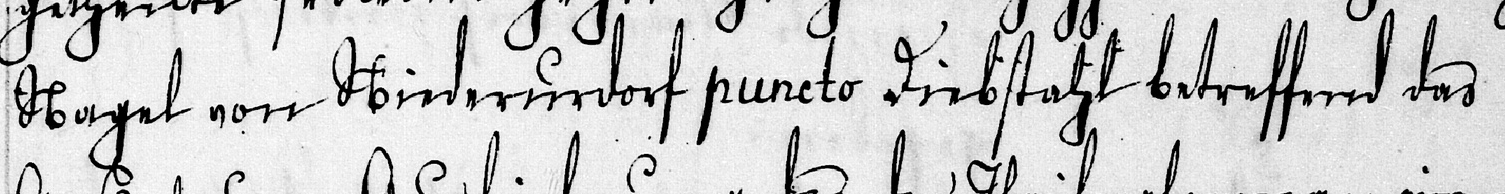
Nagel von Niederurdorf puncto Diebstahl betreffend das
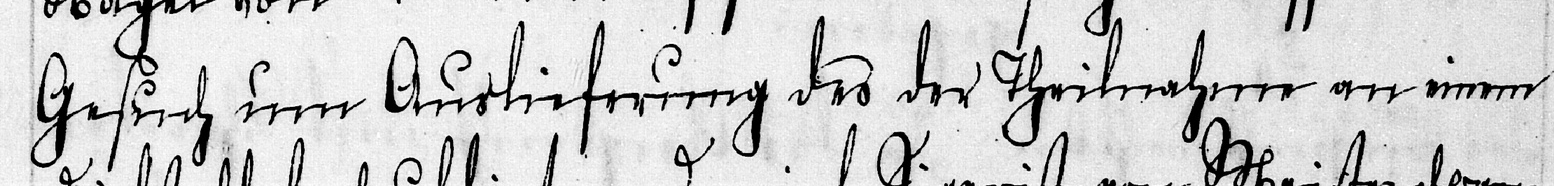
Gesuch um Auslieferung des der Theilnahme an einem
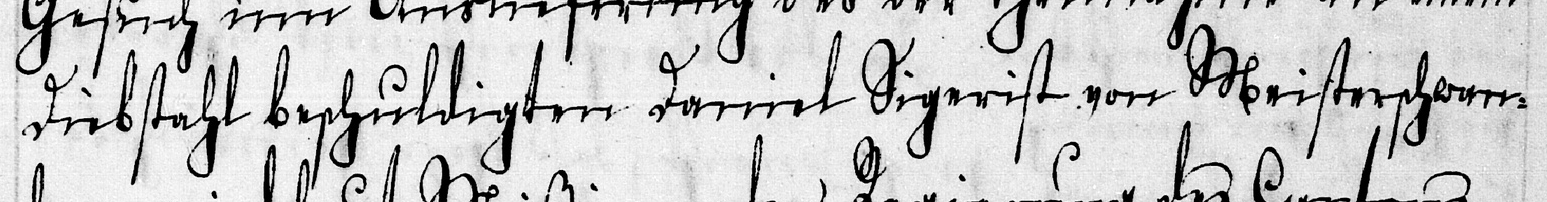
Diebstahl beschuldigten Daniel Sigerist von Meisterschwan¬
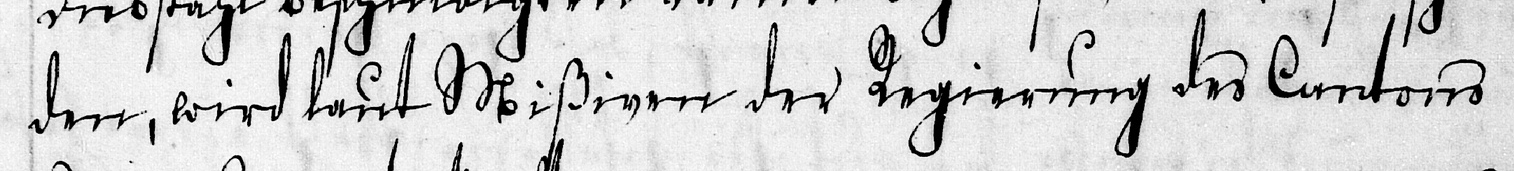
den, wird laut Mißiven der Regierung des Cantons
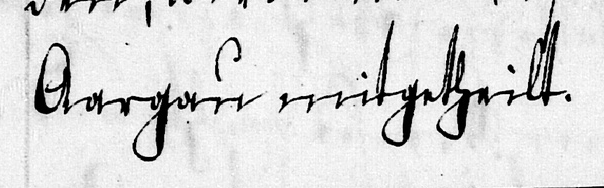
Aargau mitgetheilt.
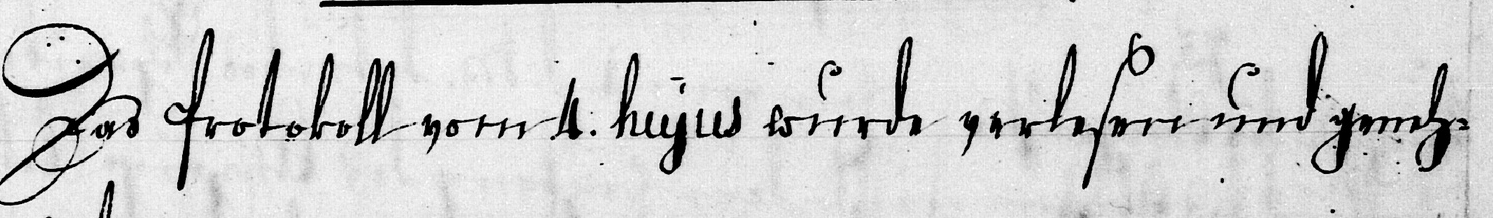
Das Protokoll vom 4. hujus wurde verlesen und geneh¬
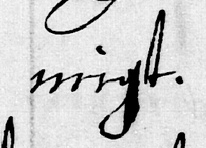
migt.
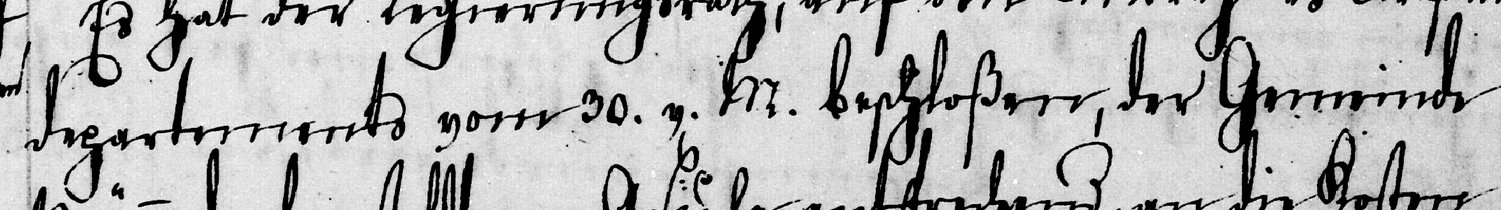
departements vom 30. v. M. beschloßen, der Gemeinde
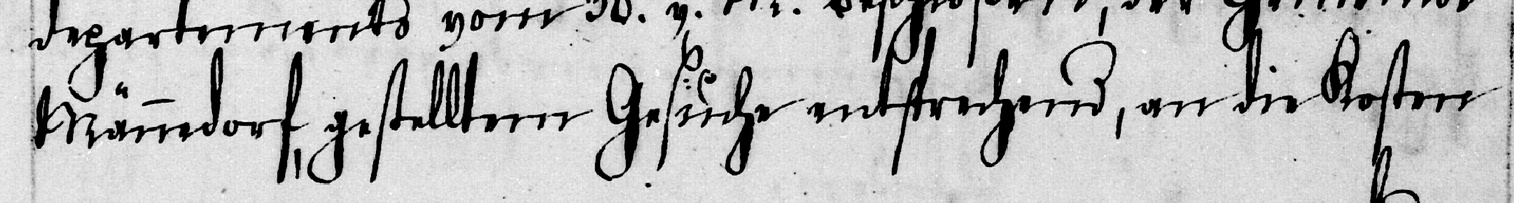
Männedorf, gestelltem Gesuche entsprechend, an die Kosten
